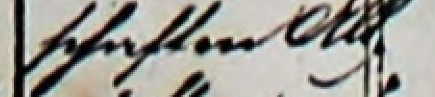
schaften Alt„
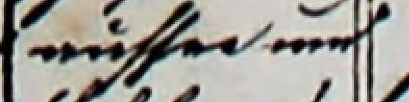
aussee und
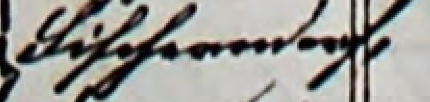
Sischerndorf,
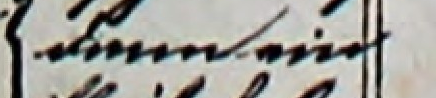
dann ein
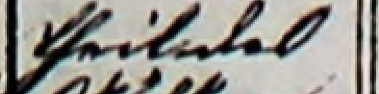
Theil des
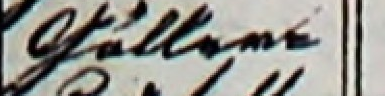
Göller=
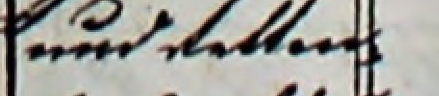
und Detten„
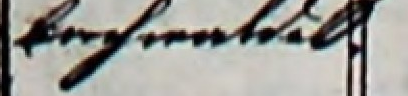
bachwaldes.
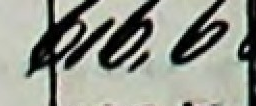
616,6
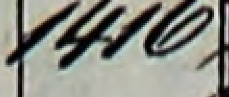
1416
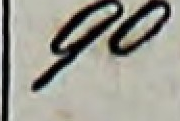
90
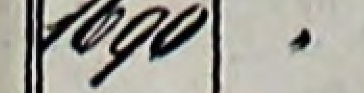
1690 „
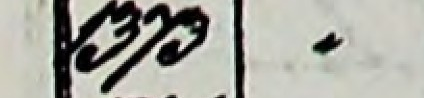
1373 „
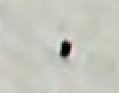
,
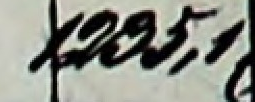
1235,1
